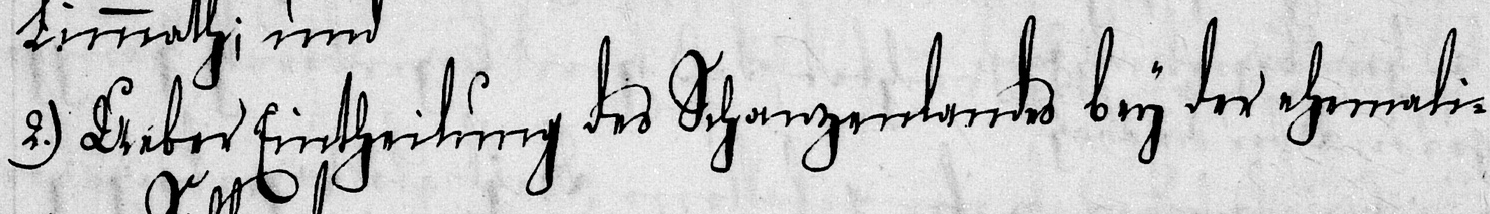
2.) Ueber Eintheilung des Schanzenlandes bey der ehemali¬
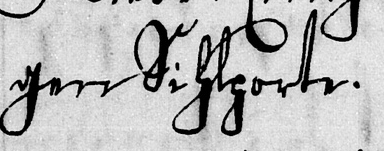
gen Sihlporte.
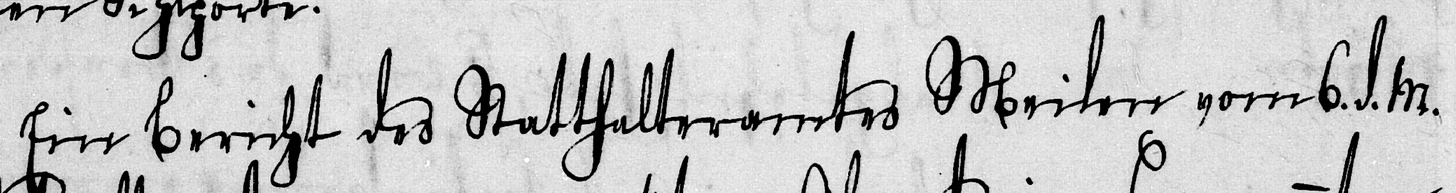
Ein Bericht des Statthalteramtes Meilen vom 6. d. M.
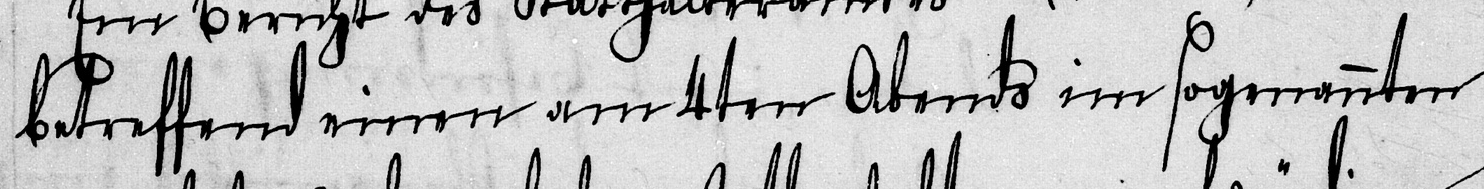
betreffend einen am 4ten Abends im sogenannten
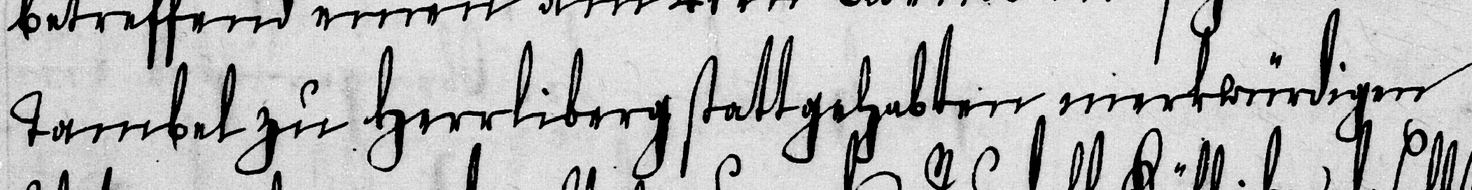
Tambel zu Herrliberg stattgehabten merkwürdigen
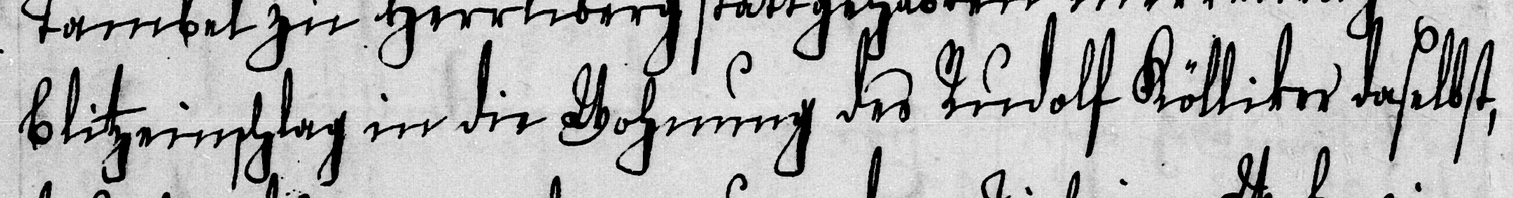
Blitzeinschlag in die Wohnung des Rudolf Kölliker dasel¬
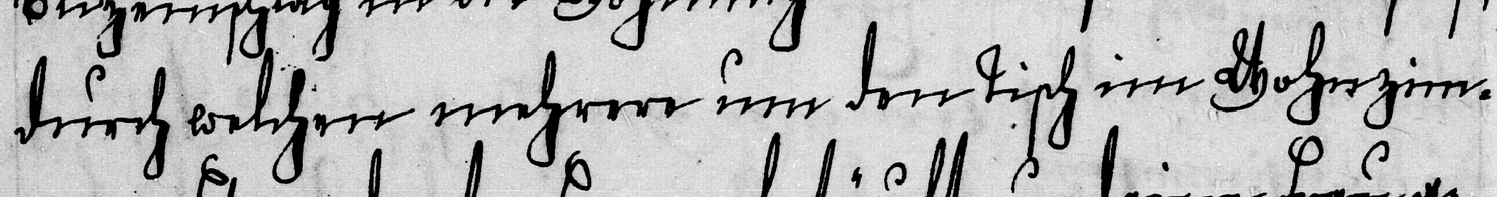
durch welchen mehrere um den Tisch im Wohnzim¬
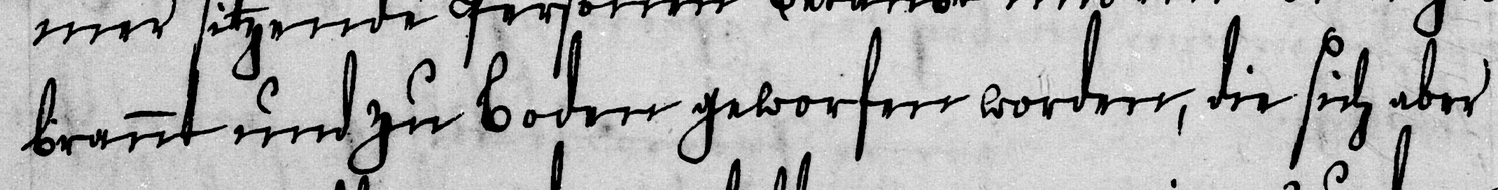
brannt und zu Boden geworfen worden, die sich aber
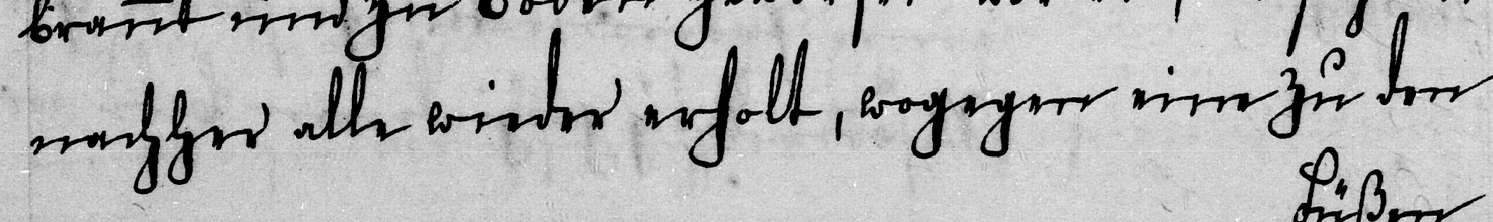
nachher alle wieder erholt, wogegen eine zu den
